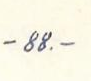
88
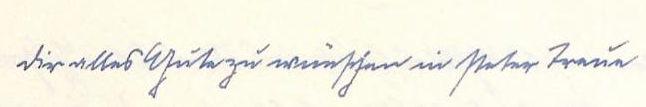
Dir alles Gute zu wünschen in steter Treue
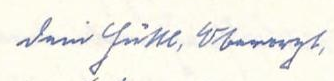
Dein Hüttl, Oberarzt,
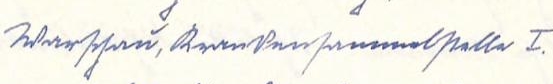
Warschau, Krankensammelstelle I.
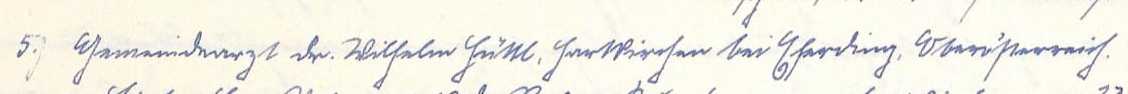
5. Gemeindearzt Dr. Wilhelm Hüttl, Hartkirchen bei Eferding, Oberösterreich.
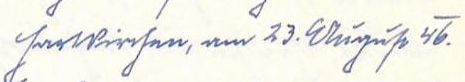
Hartkirchen, am 23. August 46.
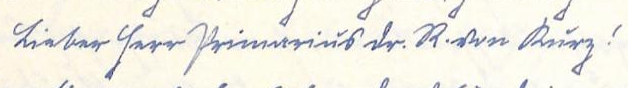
Lieber Herr Primarius Dr. R. von Kurz!
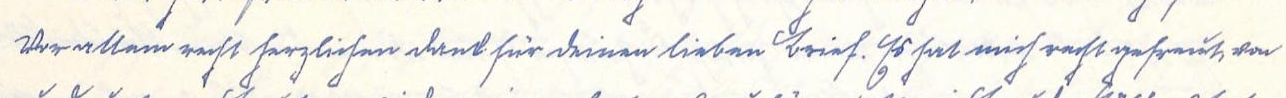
Vor allem recht herzlichen Dank für deinen lieben Brief. Es hat mich recht gefreut, von
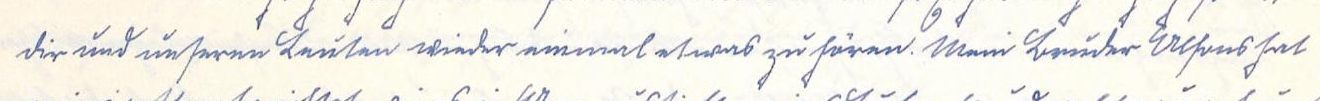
dir und unseren Leuten wieder einmal etwas zu hören. Mein Bruder Alfons hat
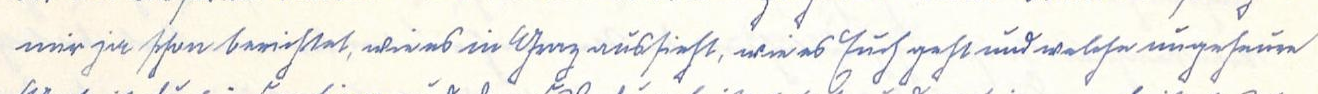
mir ja schon berichtet, wie es in Graz aussieht, wie es Euch geht und welche ungeheure
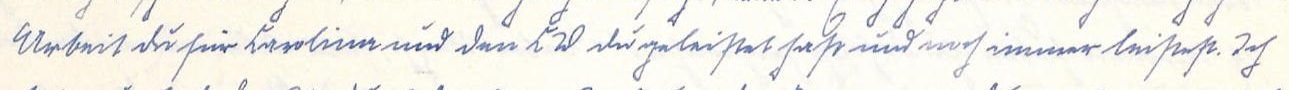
Arbeit fu für Carolina und den CV du geleistet hast und noch immer leistest. Ich
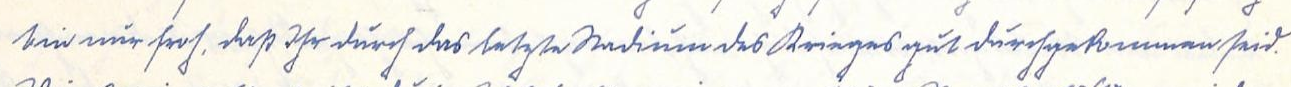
bin nur froh, daß Ihr durch das letzte Stadium des Krieges gut durchgekommen seid.
